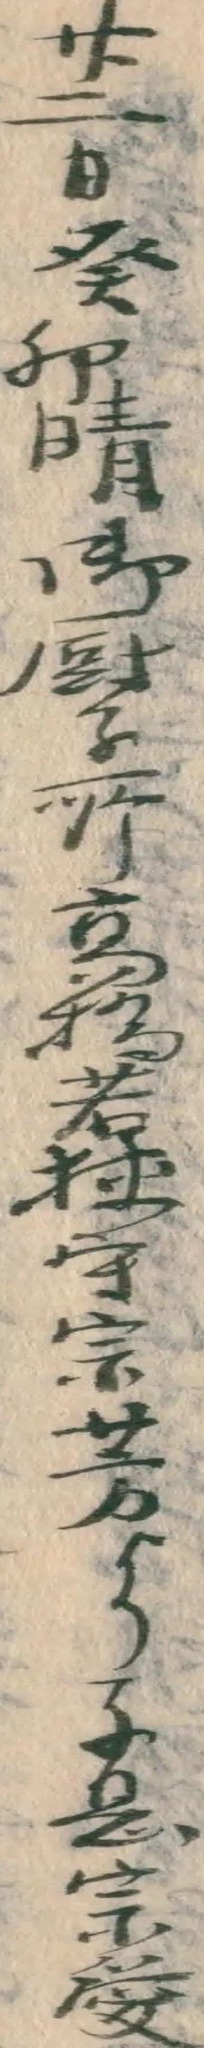廿二日癸卯晴御厨子所高橋若狭守宗芳より子息宗愛
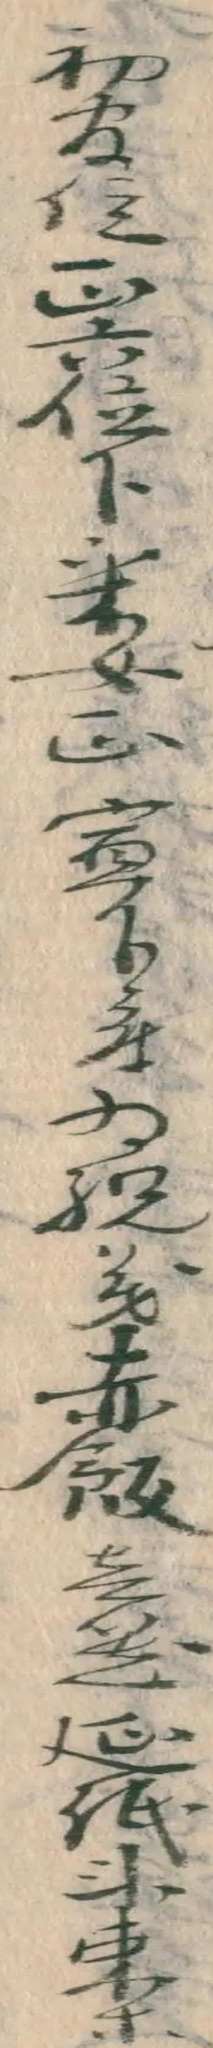初官位正六位下采女正宣下ニ付為祝義赤飯壱箱延紙斗束等
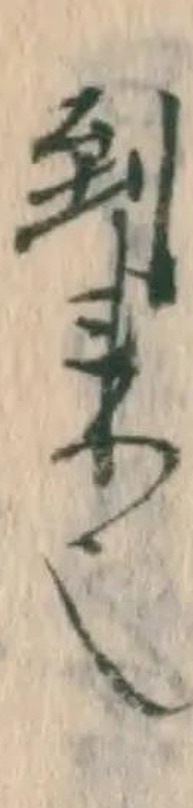到来也
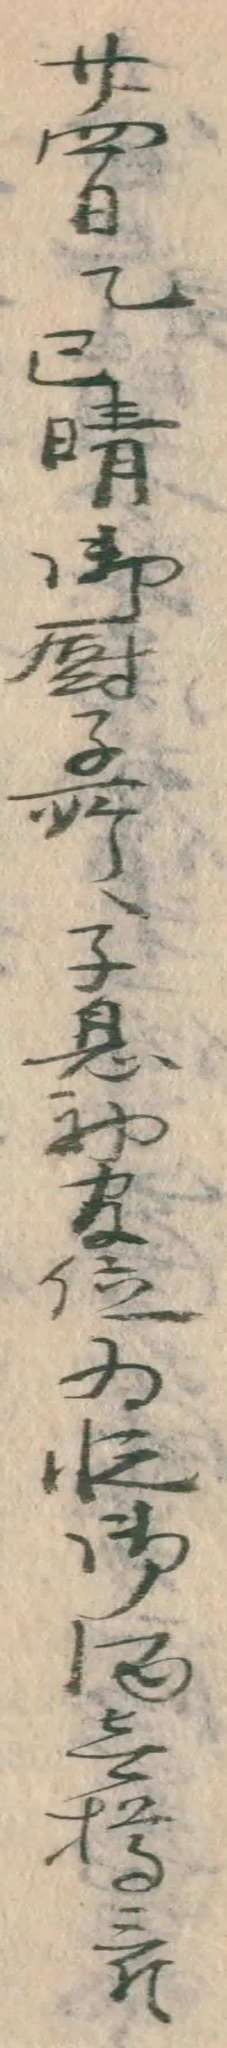廿四日乙巳晴御厨子所へ子息初官位為祝御酒壱樽三升
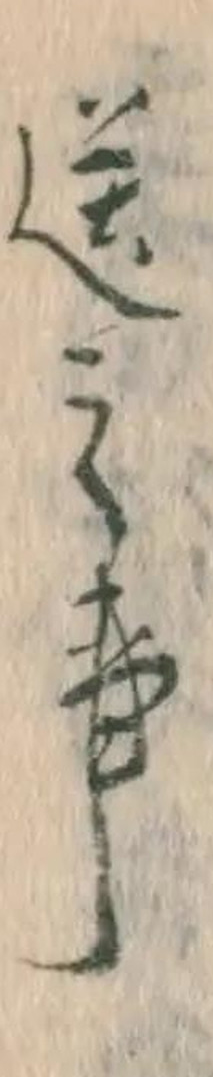送之事
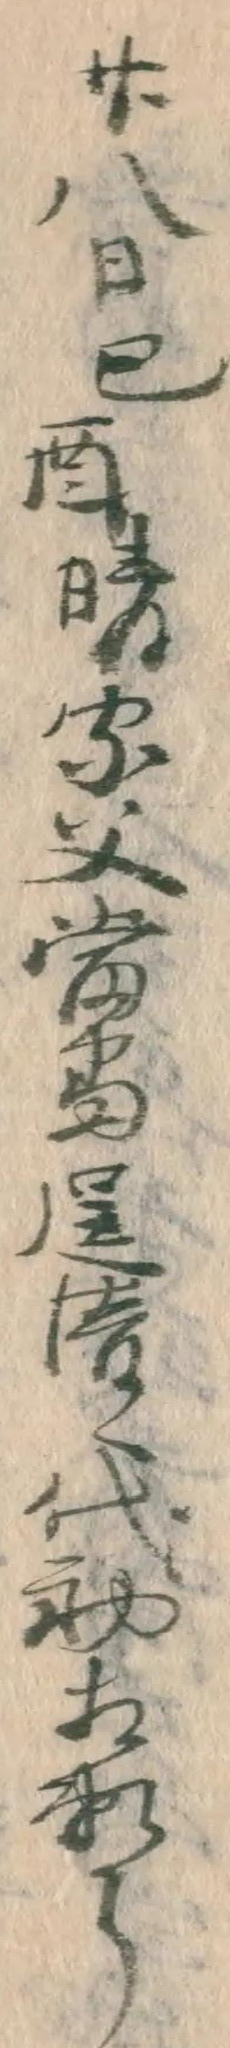廿八日巳酉晴家父當番逞清ヘ代勤相頼了
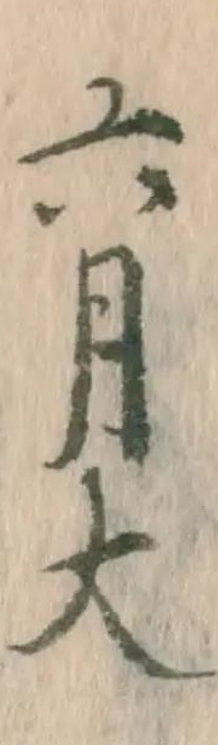六月大
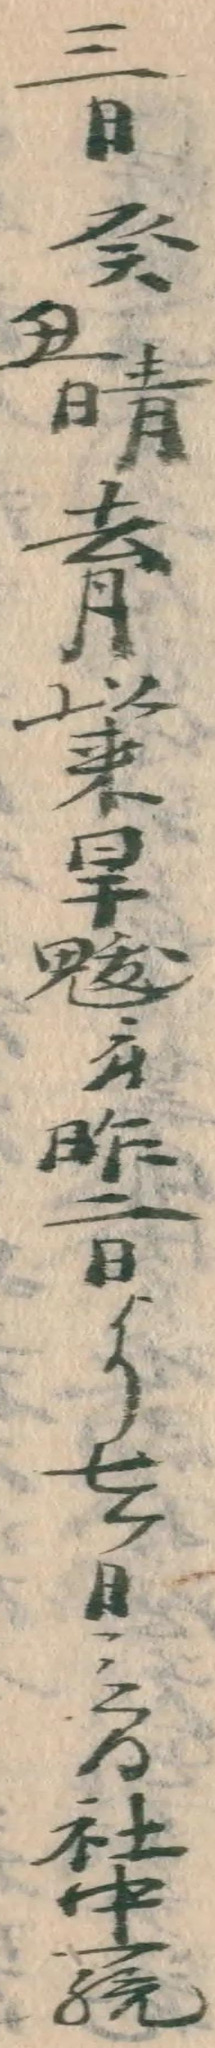三日癸丑晴去月以来旱魃ニ付昨二日より七ケ日之間社中一統
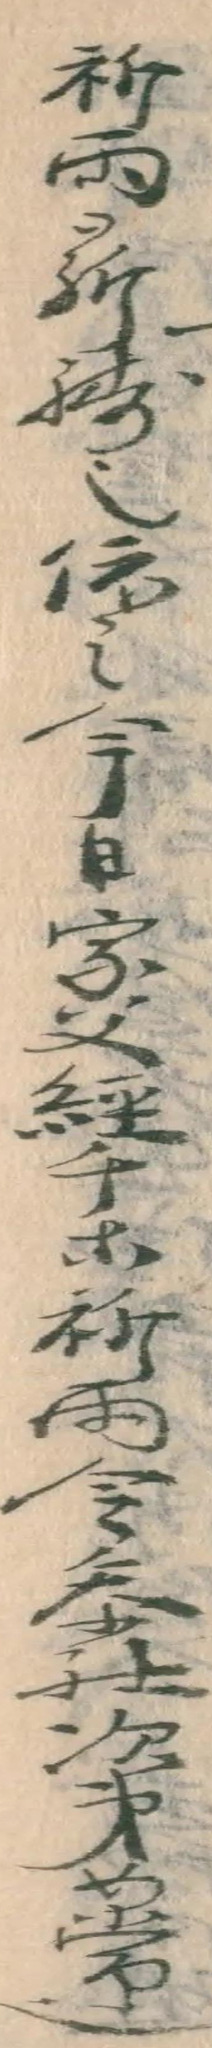祈雨御祈祷也依之今日家父経千等祈雨令参社次第如常也
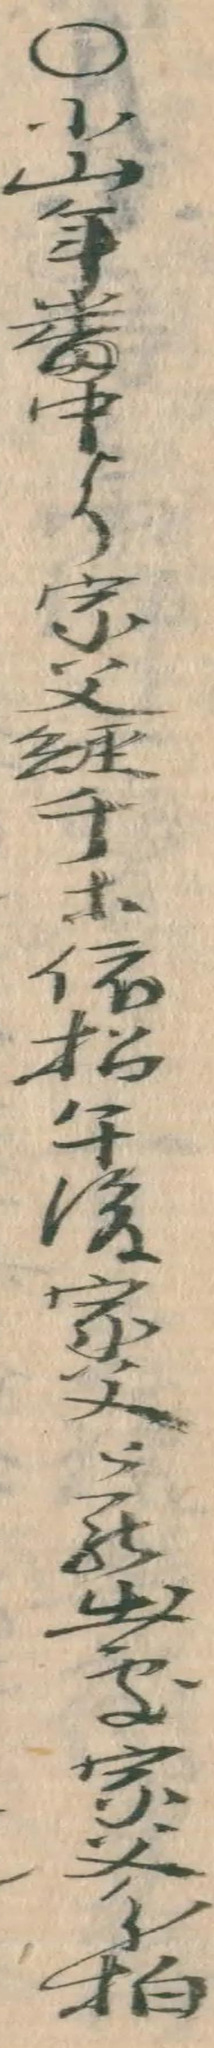〇小山年番中より家父健千等依招午後家父被罷出處家父分拍
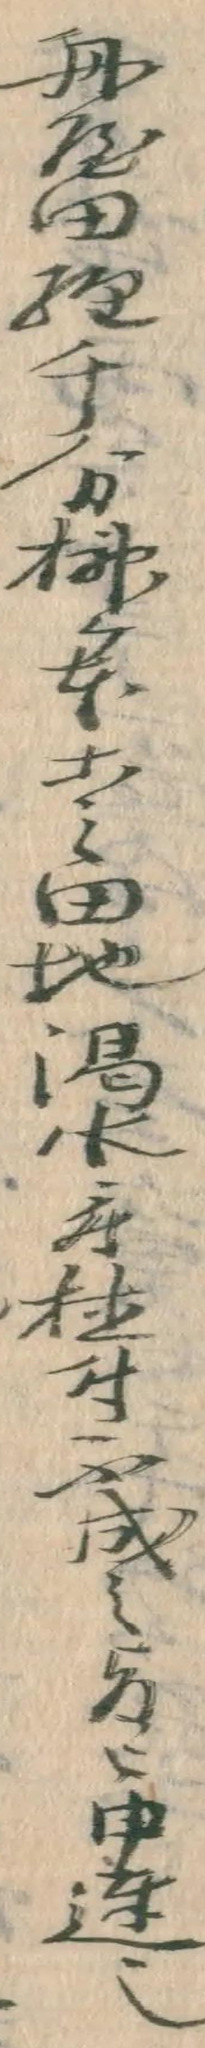舟屋田経千分榊ケ本等之田地渇水ニ付植付不成之旨被申達也
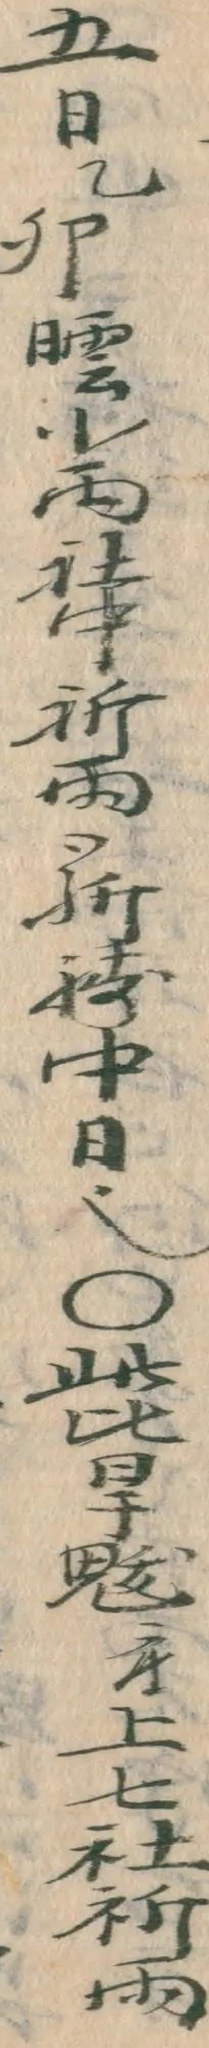五日乙卯曇小雨社中祈雨御祈祷中日也〇此比旱魃ニ付上七社祈雨
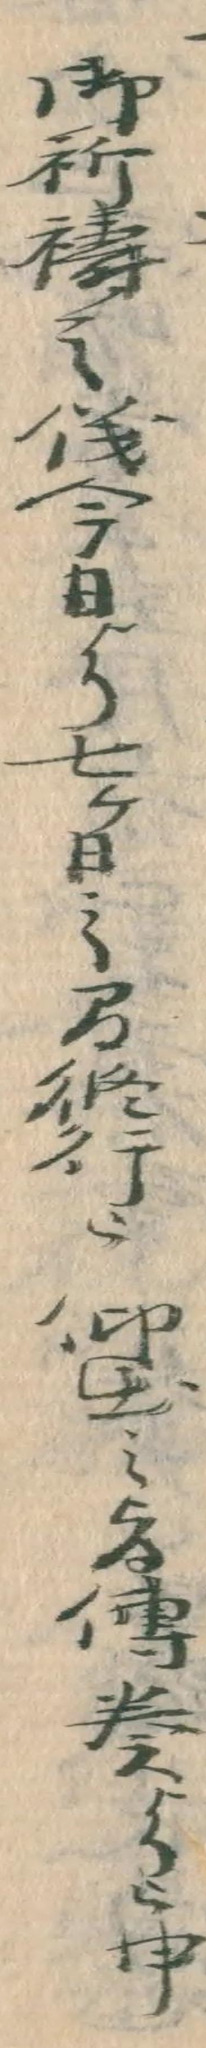御祈祷之儀今日より七ヶ日之間修行被仰出之旨傳奏より被申
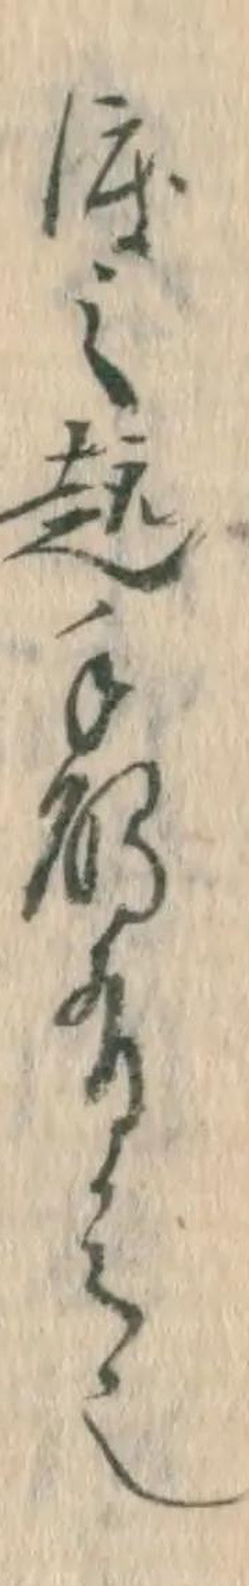渡之趣手触有之也
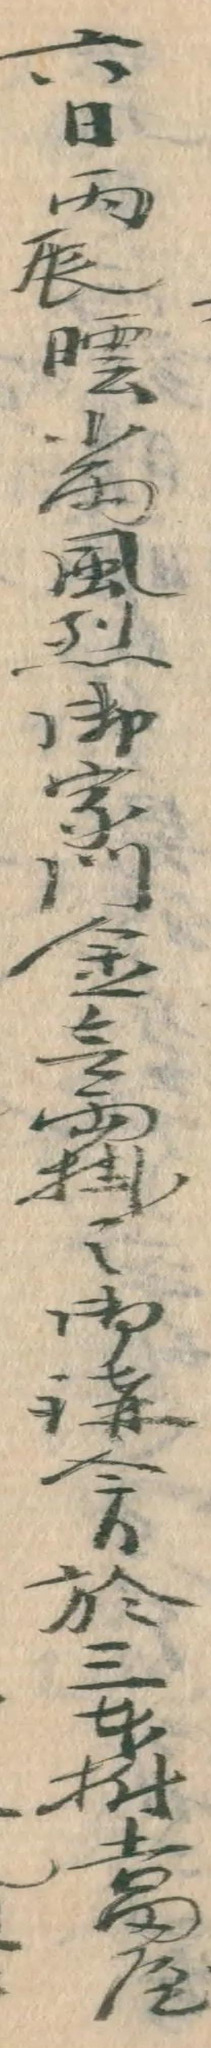六日丙辰曇小雨風烈御家門金壱両掛之御講今日於三本附當屋
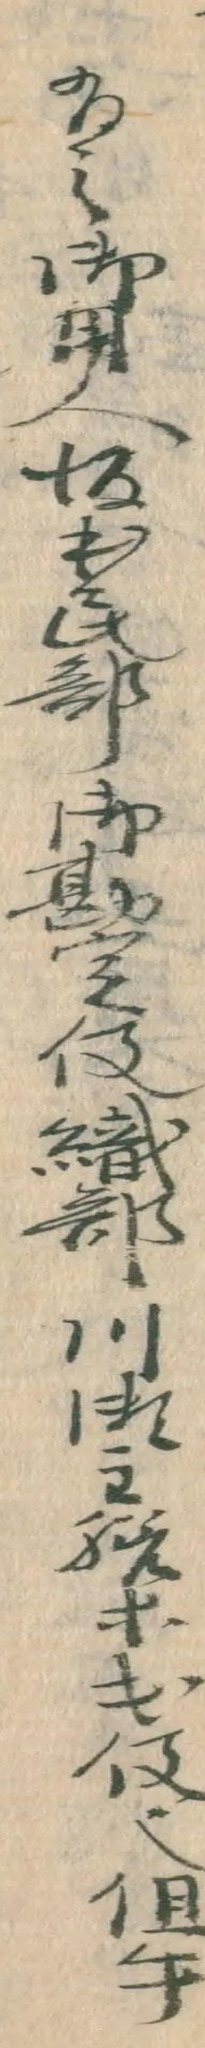有之御用人坂本民部御勘定役織部川瀬主税等出役也但午
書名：賀茂社記録. 第65冊
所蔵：国立国会図書館 National Diet Library, JAPAN
